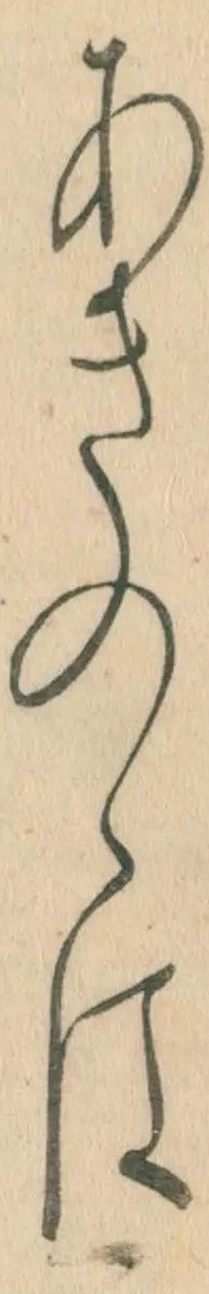あきのゝは
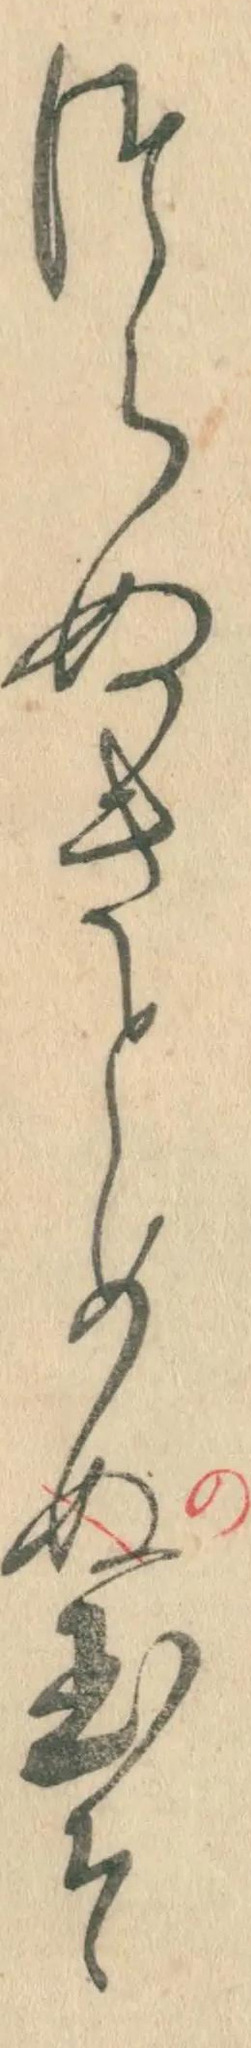つらぬきとめぬ玉そ
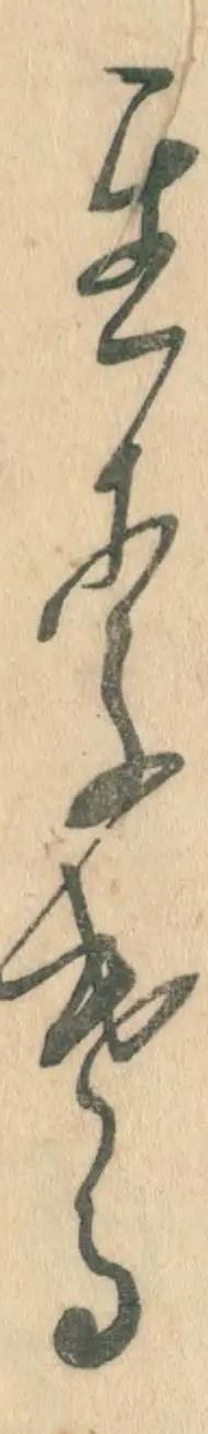ちりける

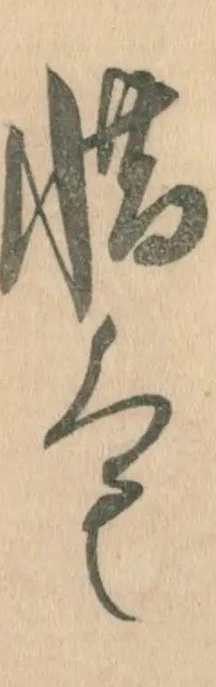惜くも
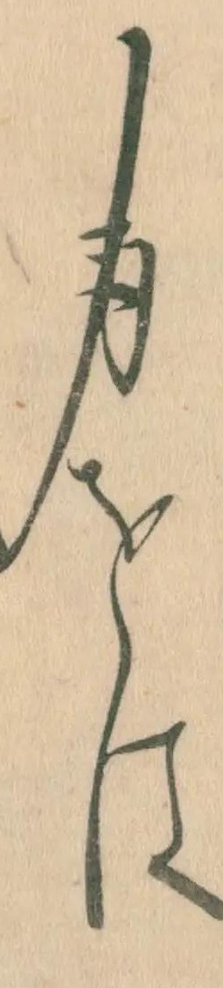身をは
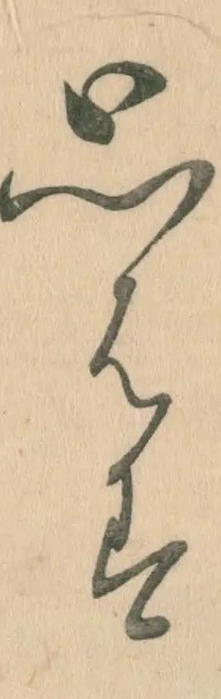思はす
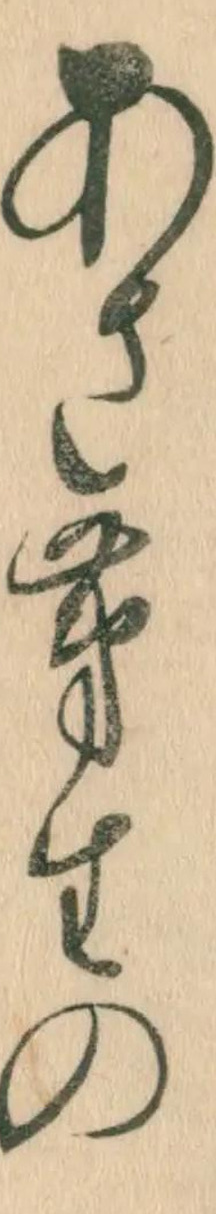あさ茅生の
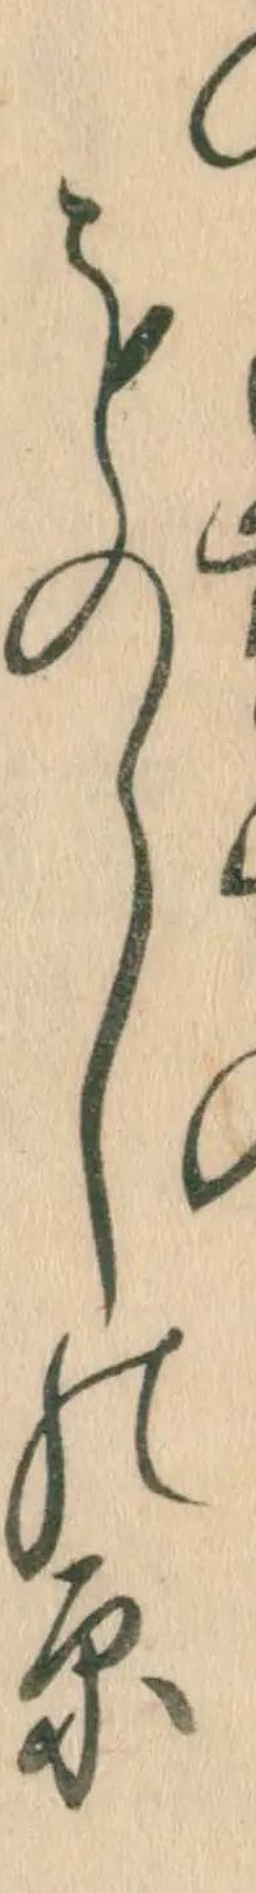をのゝしの原
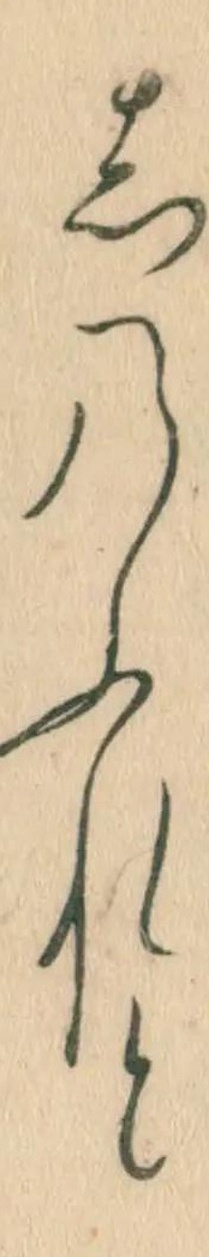しのふれと
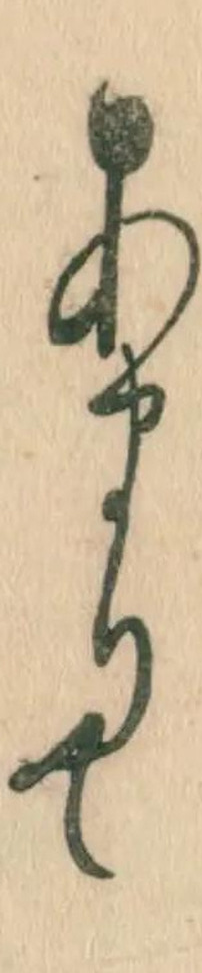あまりて

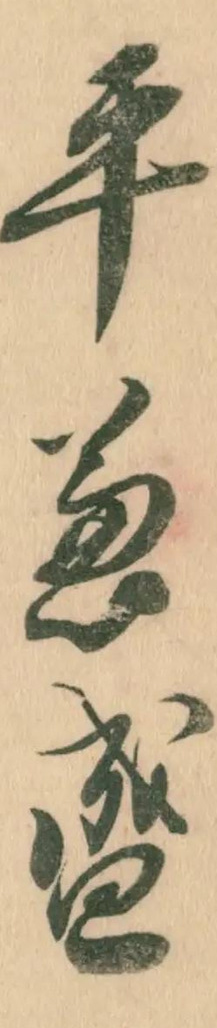平兼盛
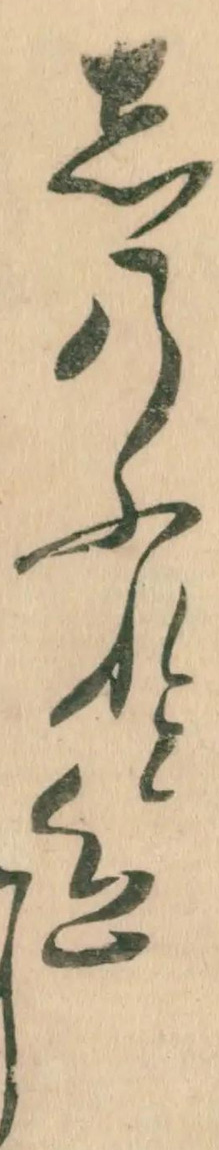しのふれと色
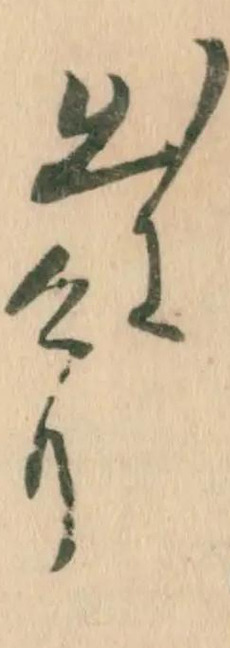出にけり
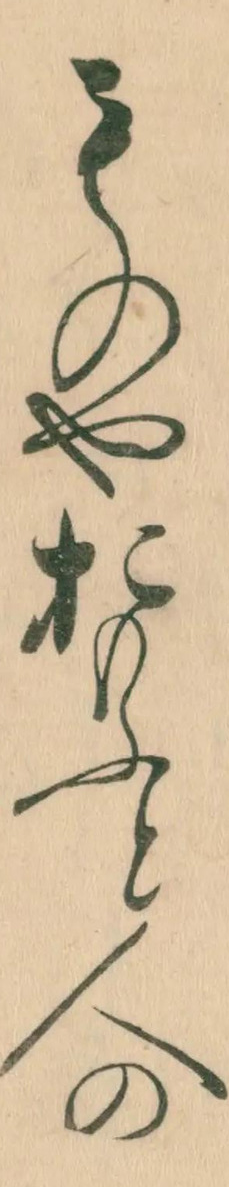ものやおもふと人の
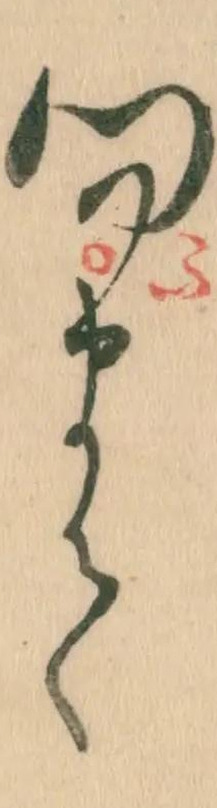問まて
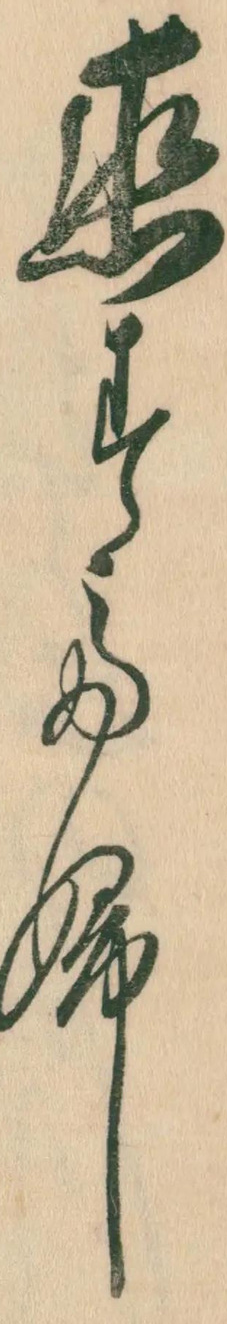恋すてふ
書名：錦百人一首あつま織
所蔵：国立国会図書館 National Diet Library, JAPAN
